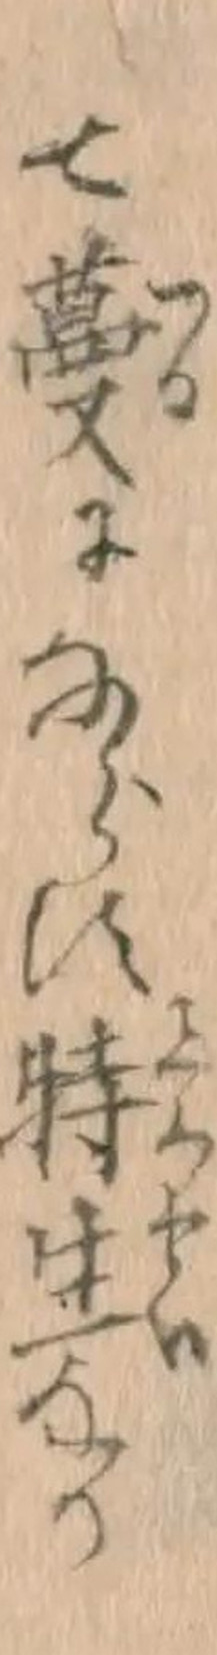て蔓にならす特生なり
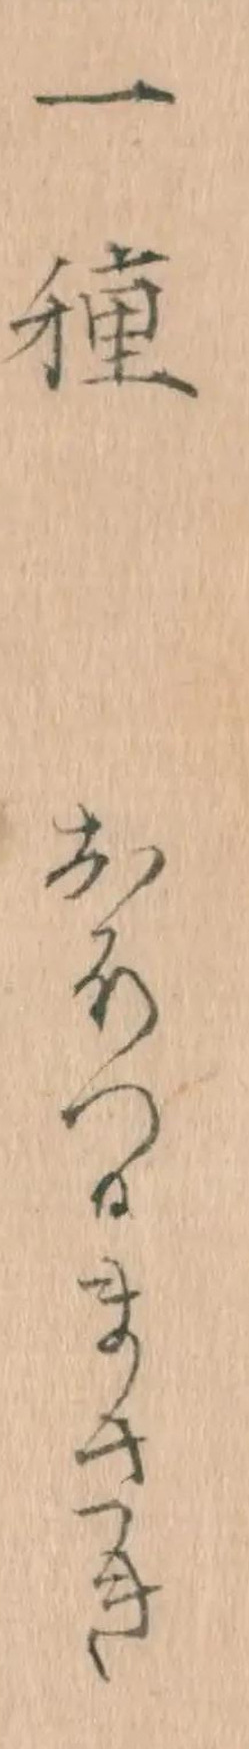一種おほつるまさき
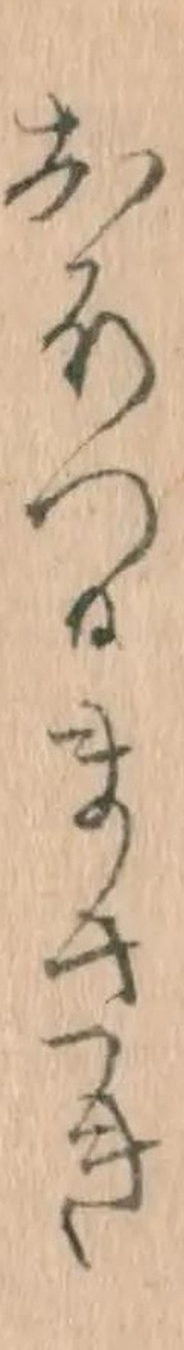おほつるまさき
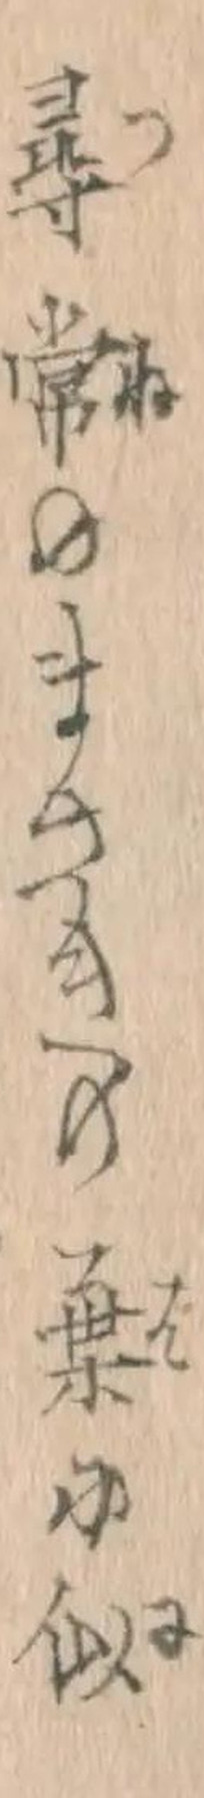尋常のまさきの葉に似
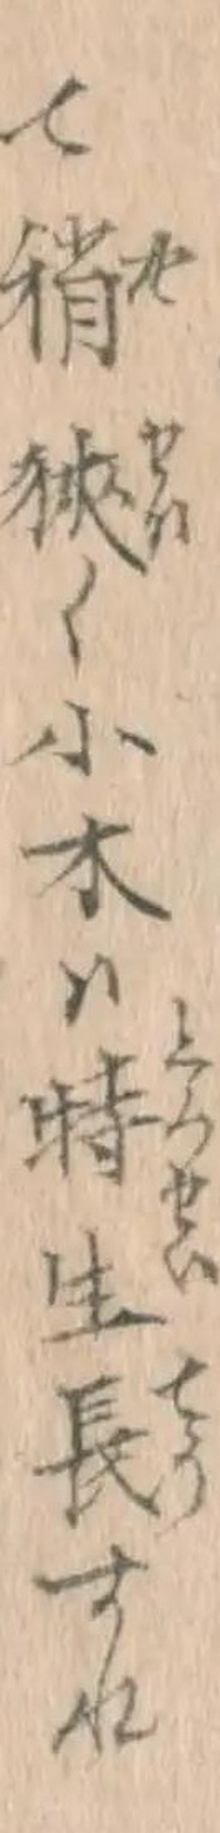て稍狭く小木は特生長すれ
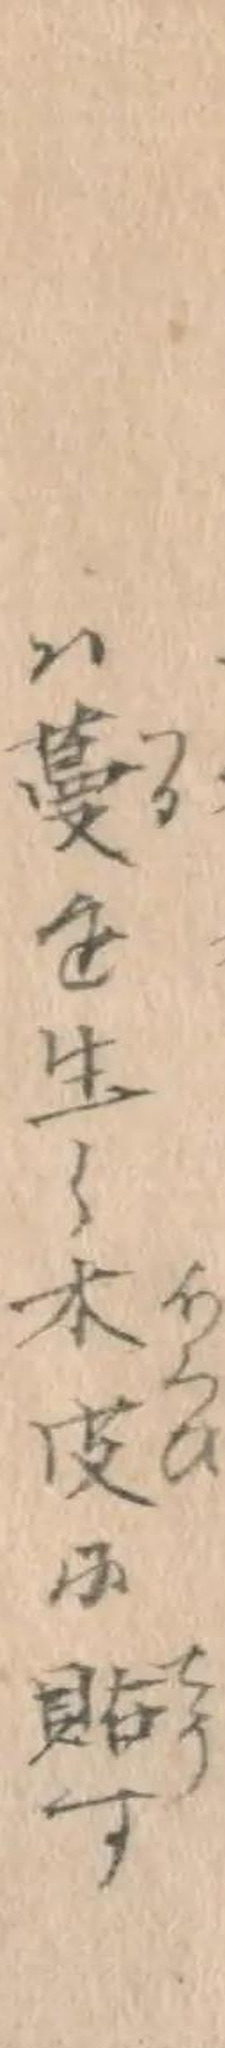は蔓を生し木皮に貼す
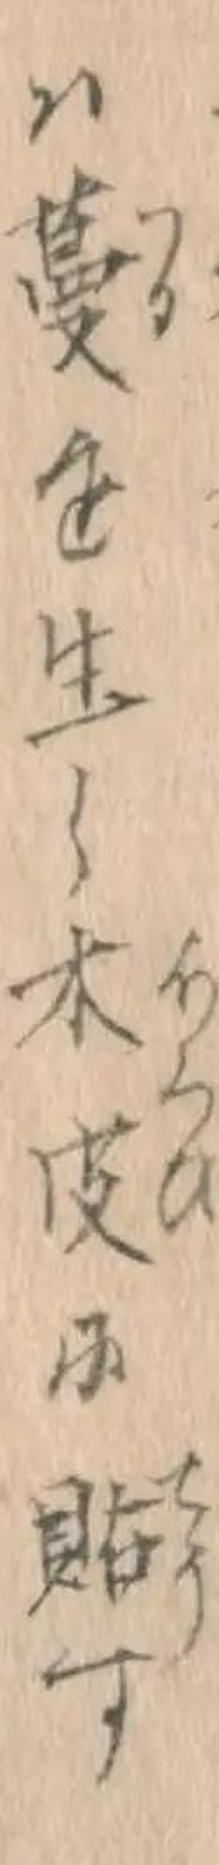は蔓を生し木皮に貼す

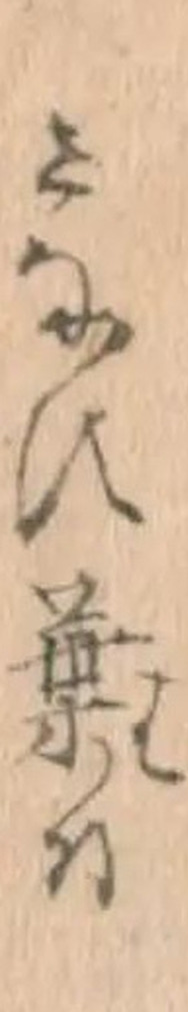となす葉は
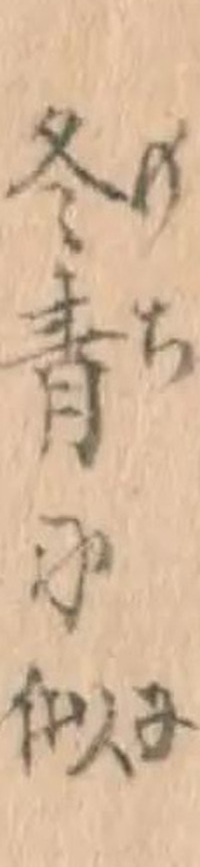冬青に似
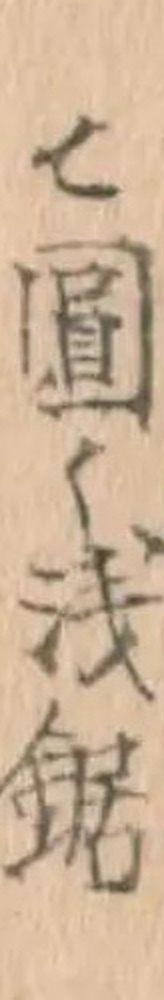て円く浅鋸
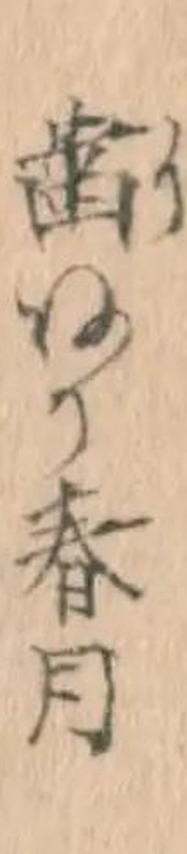歯あり春月
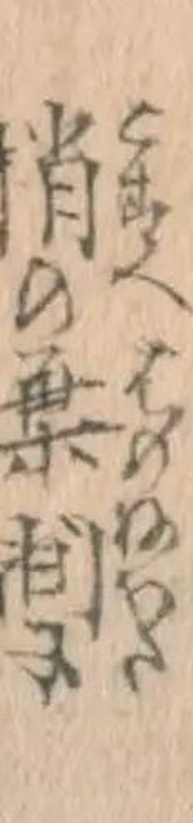梢の葉間に
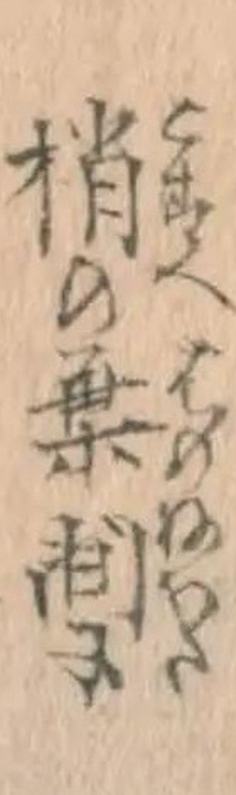梢の葉間に
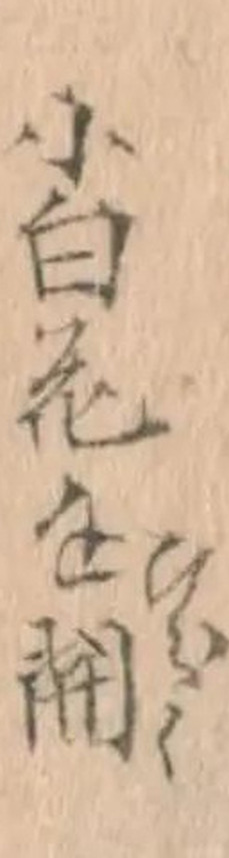小白花を開
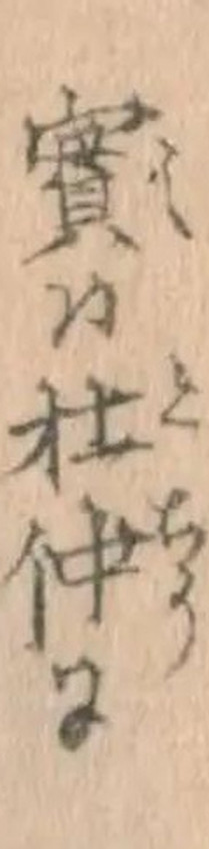実は杜仲に
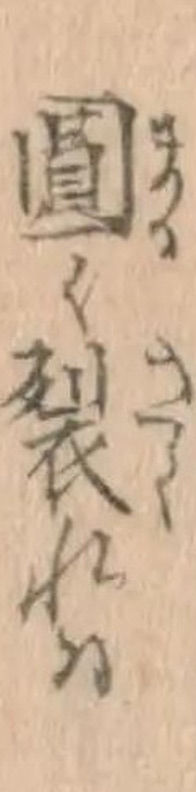円く裂れは
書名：本草図譜. 巻31-33
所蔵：国立国会図書館 National Diet Library, JAPAN
